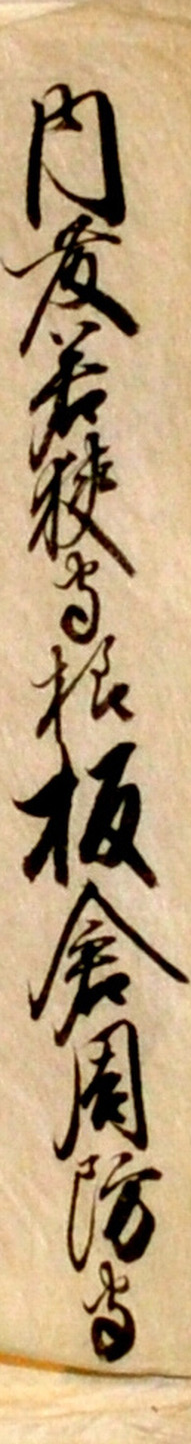内藤若狭守様板倉周防守

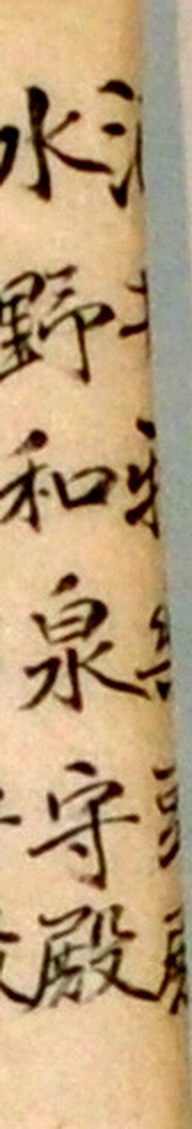水野和泉守殿
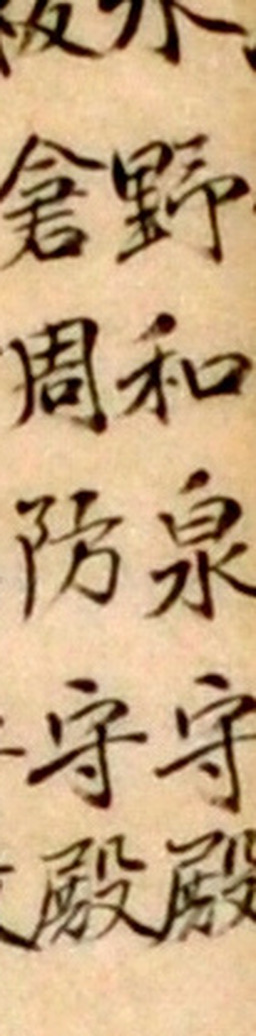板倉周防守殿
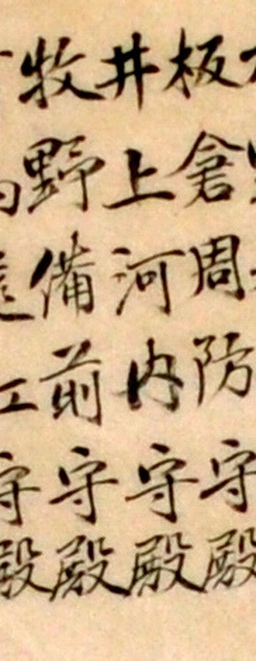牧野備前守殿
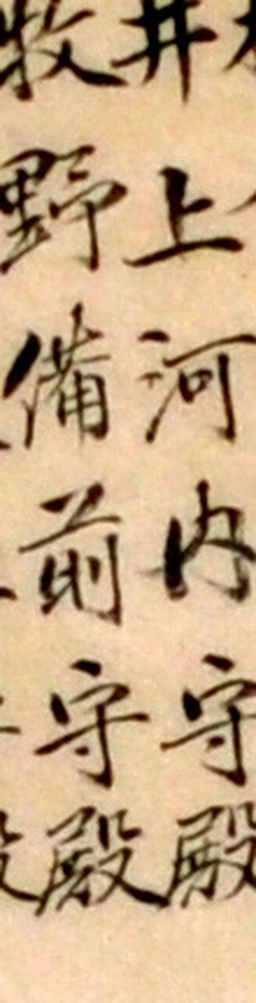牧野備前守殿
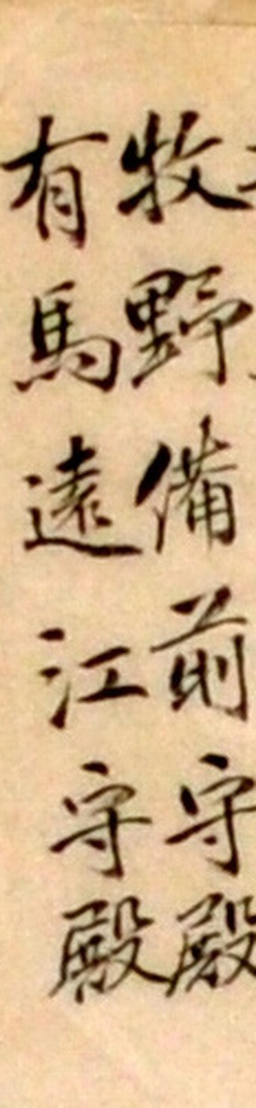有馬遠江守殿

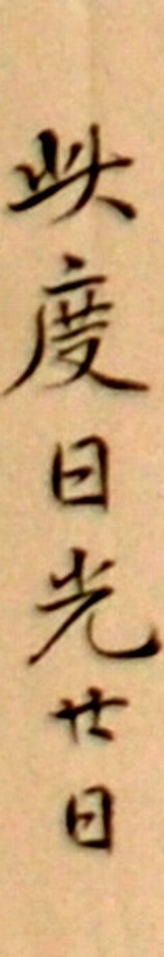此度日光廿日
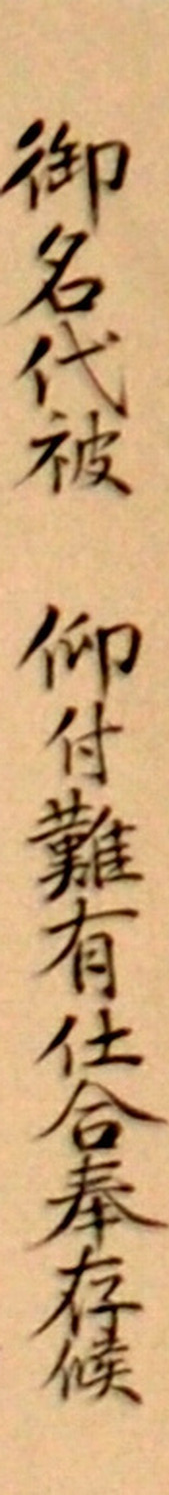御名代被仰付難有仕合奉存候
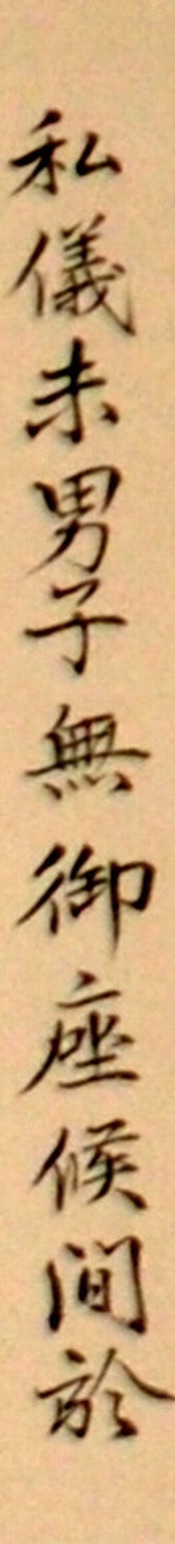私儀未男子無御座候間於
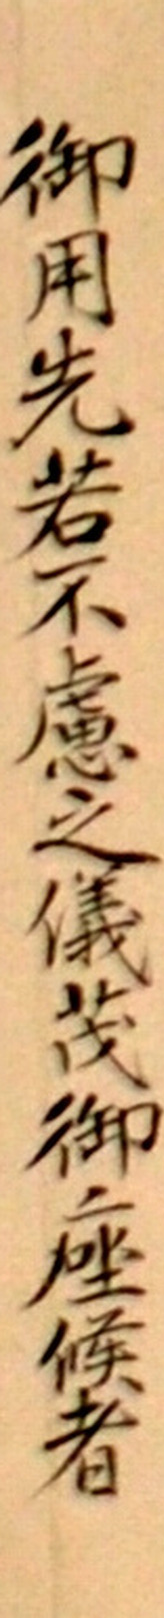御用先若不慮之儀茂御座候者
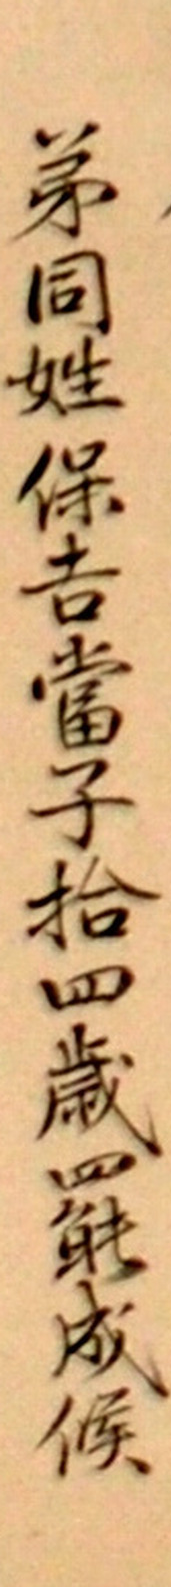弟同姓保𠮷当子拾四歳罷成候
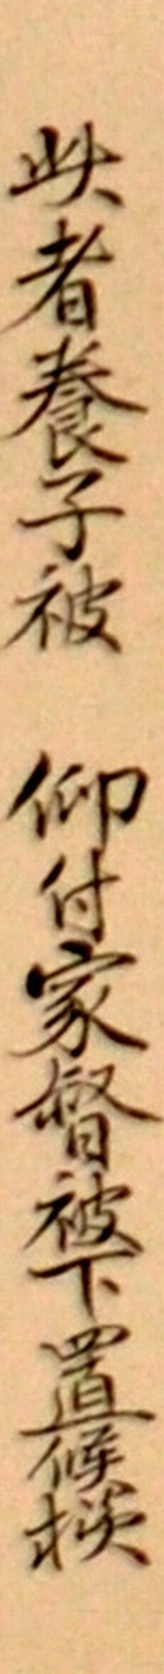此者養子被仰付家督被下置候様
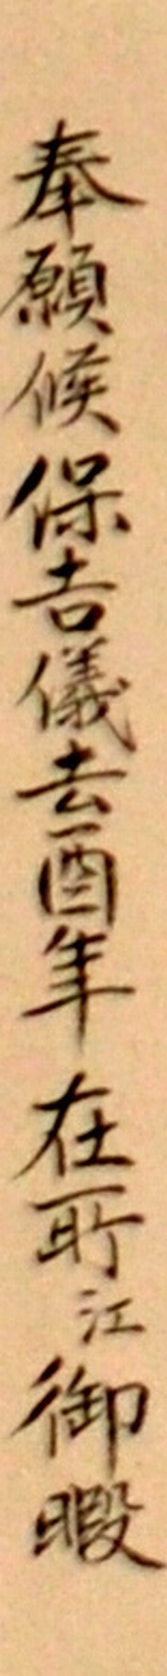奉願候保𠮷儀去酉年在所江御暇
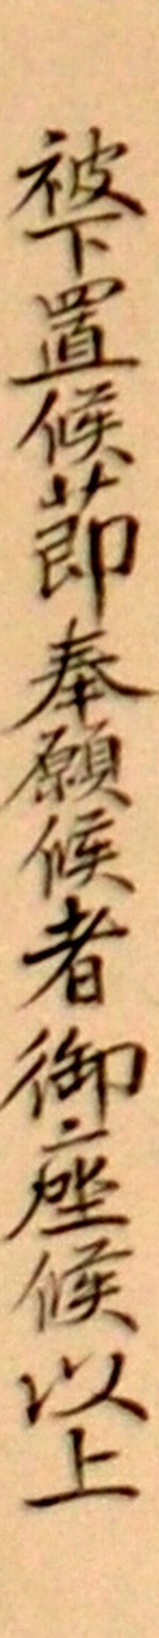被下置候節奉願候者御座候以上
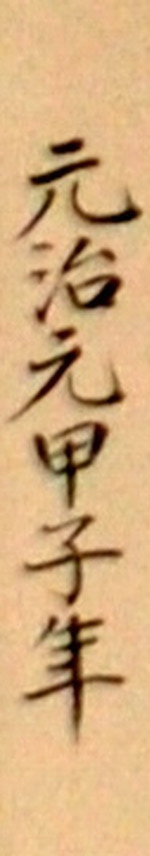元治元甲子年
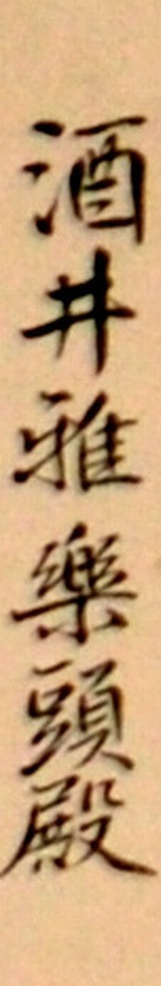酒井雅楽頭殿
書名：仮養子願
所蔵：伊那市立高遠町図書館・合同会社AMANE
